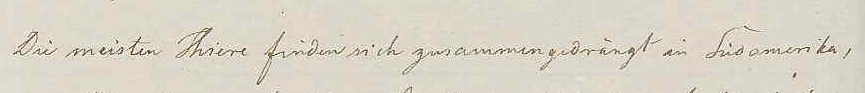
Die meisten Thiere finden sich zusammengedrängt in Südamerika,
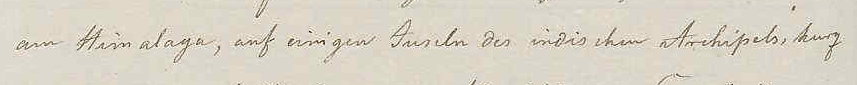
am Himalaya, auf einigen Inseln des indischen Archipels, kurz
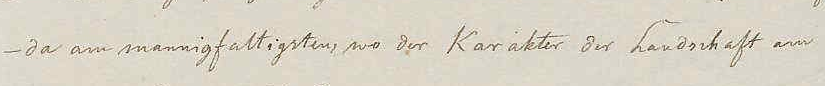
– da am mannigfaltigsten, wo der Karakter der Landschaft am
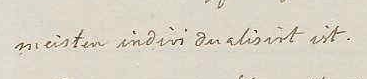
meisten individualisirt ist.
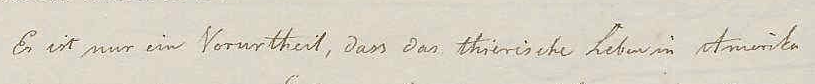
Es ist nur ein Vorurtheil, dass das thierische Leben in Amerika
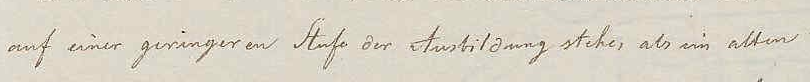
auf einer geringeren Stufe der Ausbildung stehe, als im alten
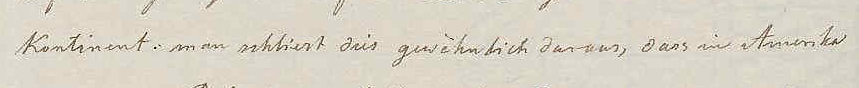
Kontinent: man schliest dies gewöhnlich daraus, dass im Amerika
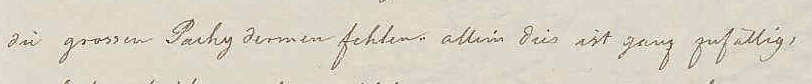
die grossen Pachydermen fehlen allein dies ist ganz zufällig,
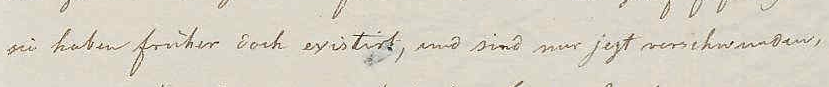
sie haben früher doch existirt, und sind nur jezt verschwunden,
